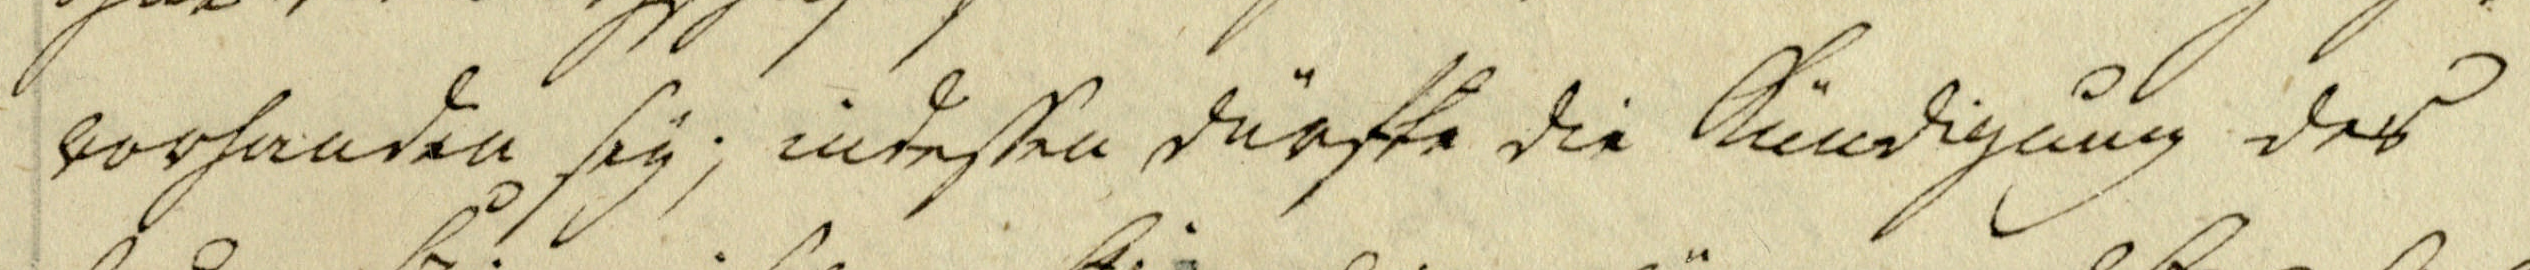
vorhanden seÿ, indessen dürfte die Kündigung der
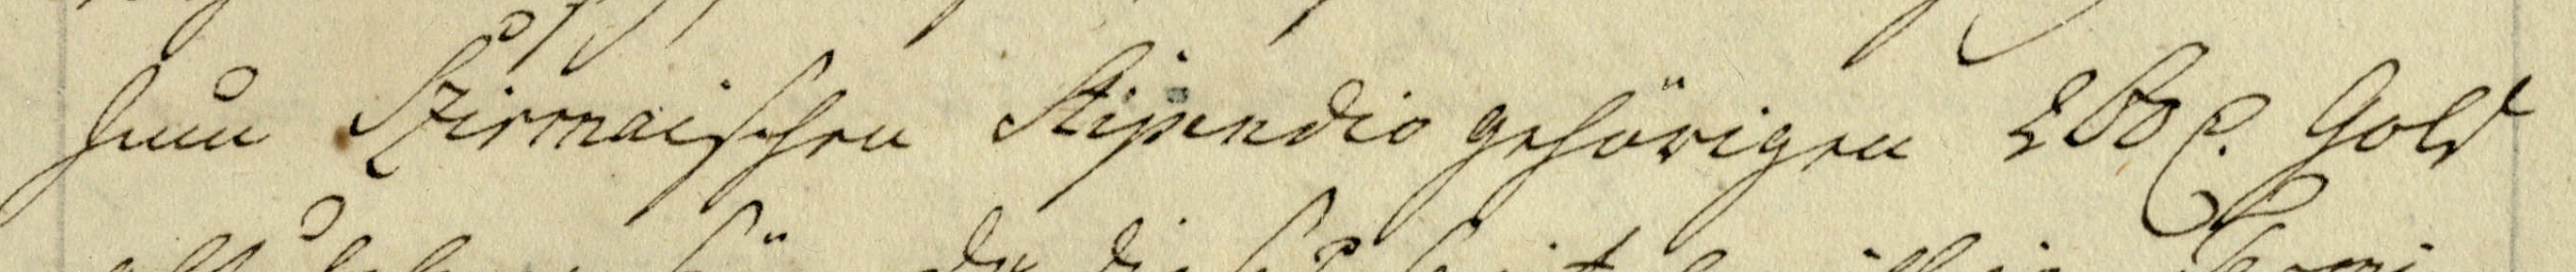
zum Szirmaischen Stipendio gehörigen 260 l. Gold
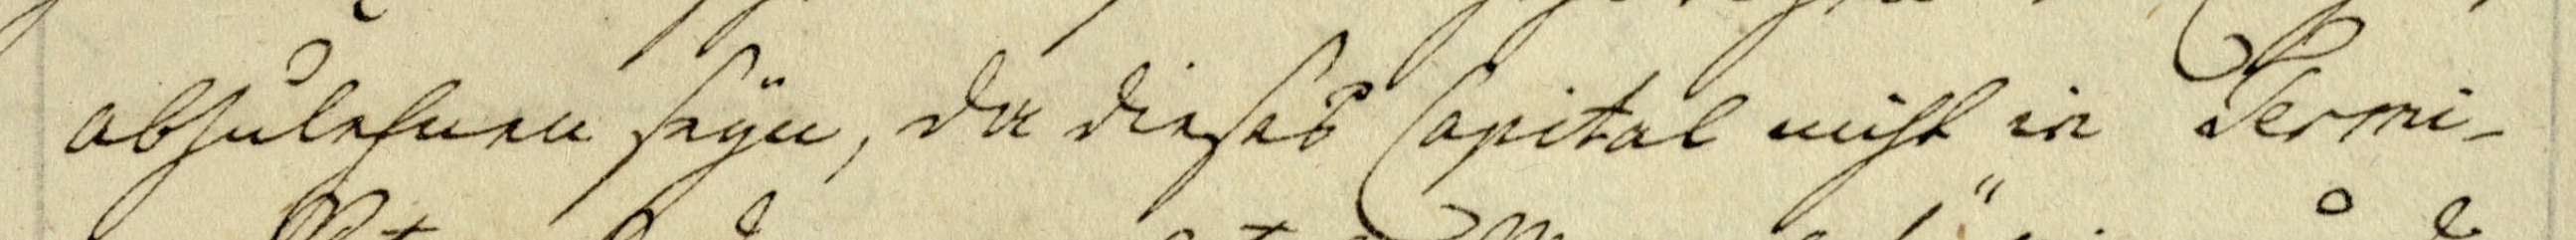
abzulehnen seÿn, da dieses Capital nicht in Termi¬
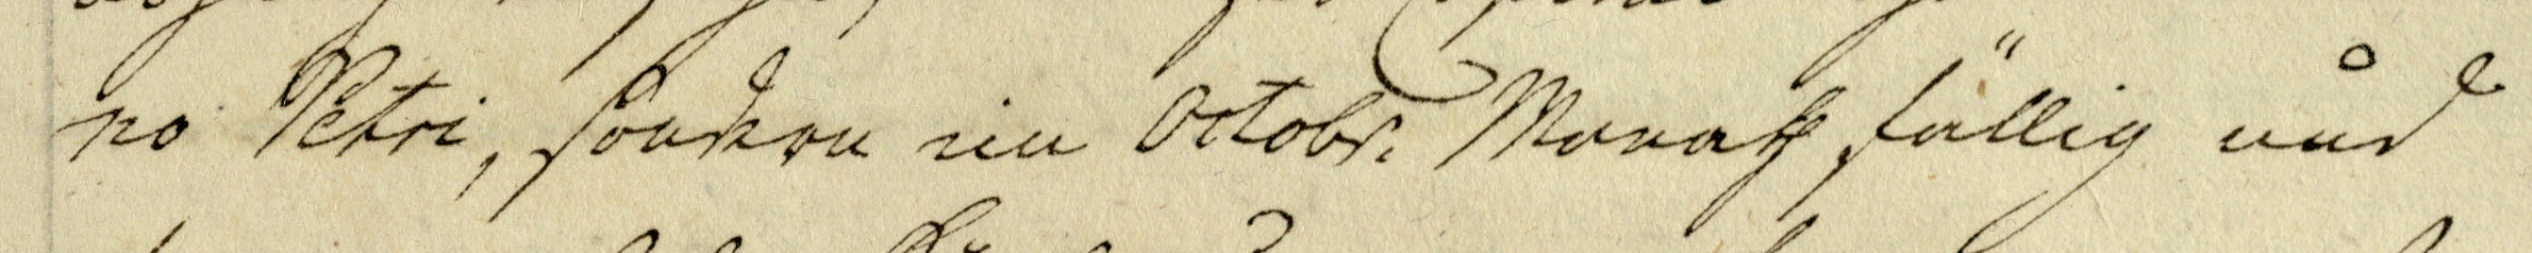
no Petri, sondern im Octobr. Monath fällig und
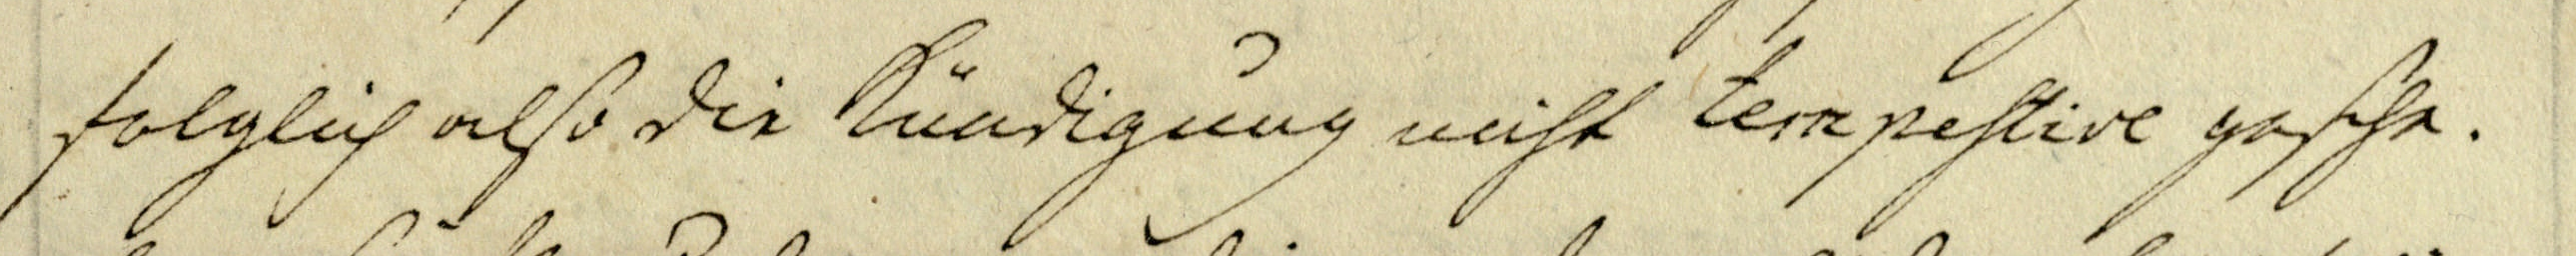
folglich also die Kündigung nicht tempestive gesche¬
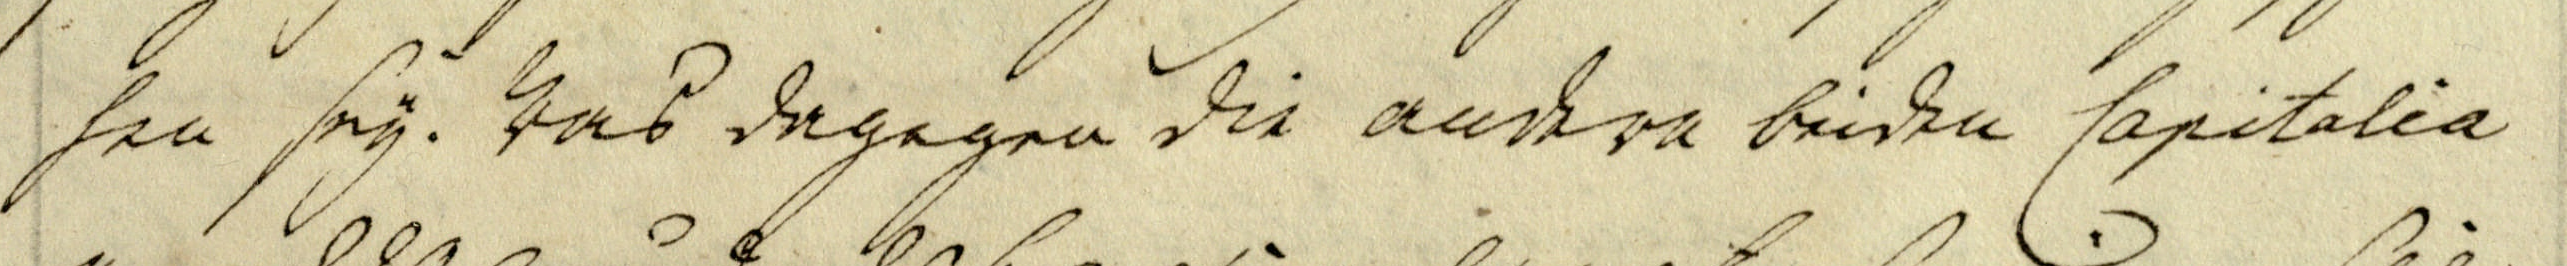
hen seÿ. Was dagegen die andern beiden Capitalia
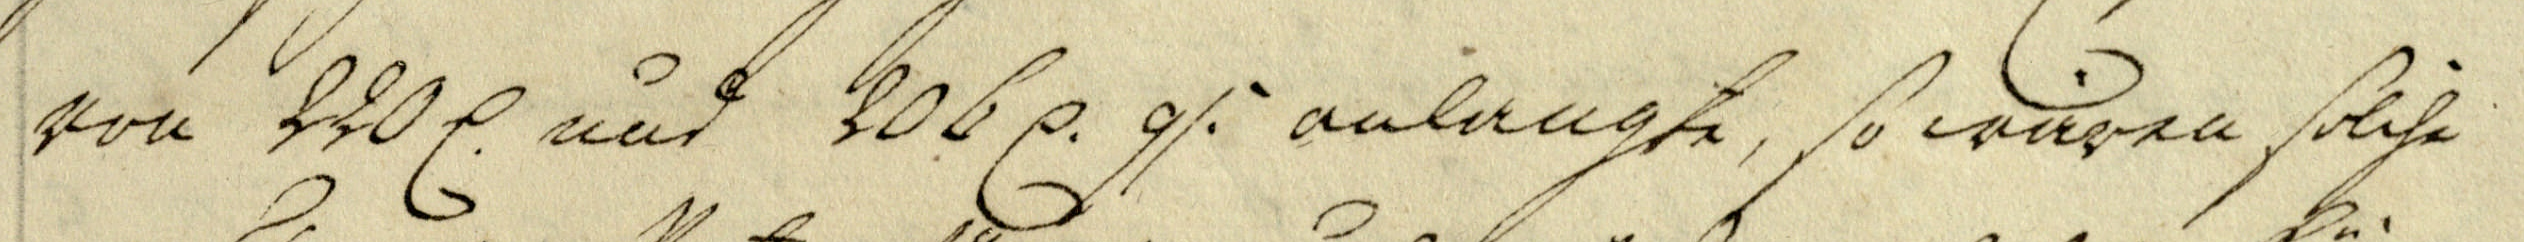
von 220 l. und 206 l. 9 s. anlangte, so wären solche
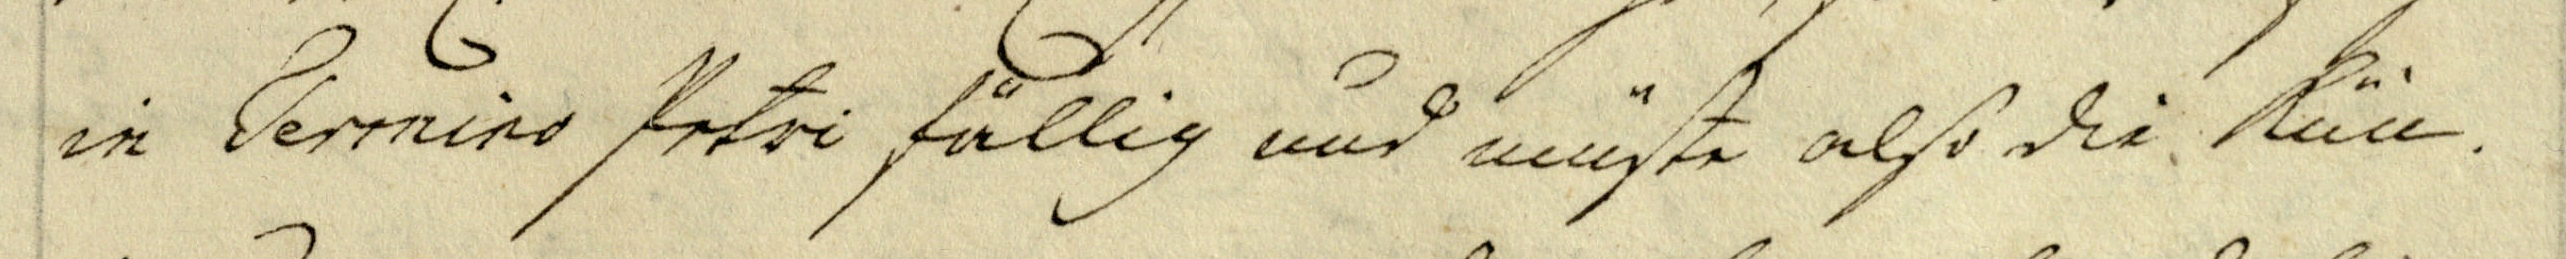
in Termino Petri fällig und müßte also die Kün¬
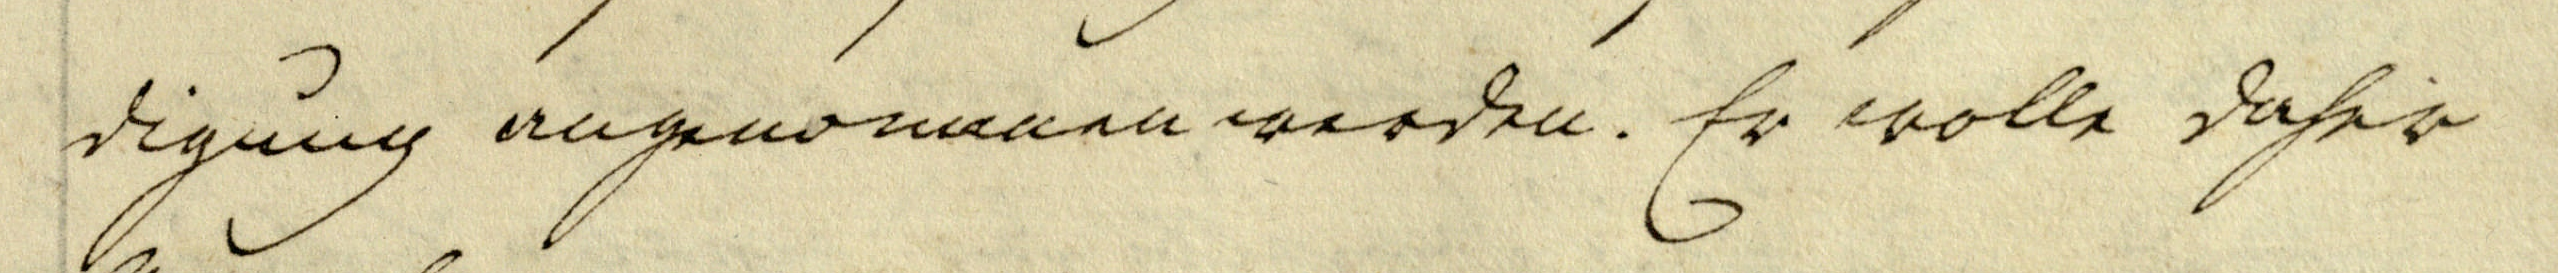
digung angenommen werden. Er wolle daher
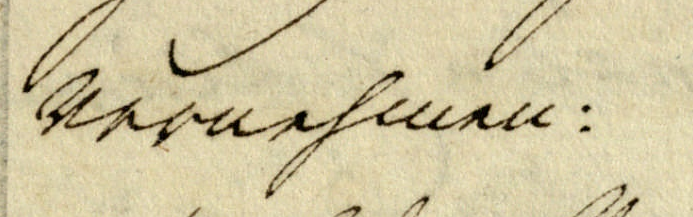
vernehmen:
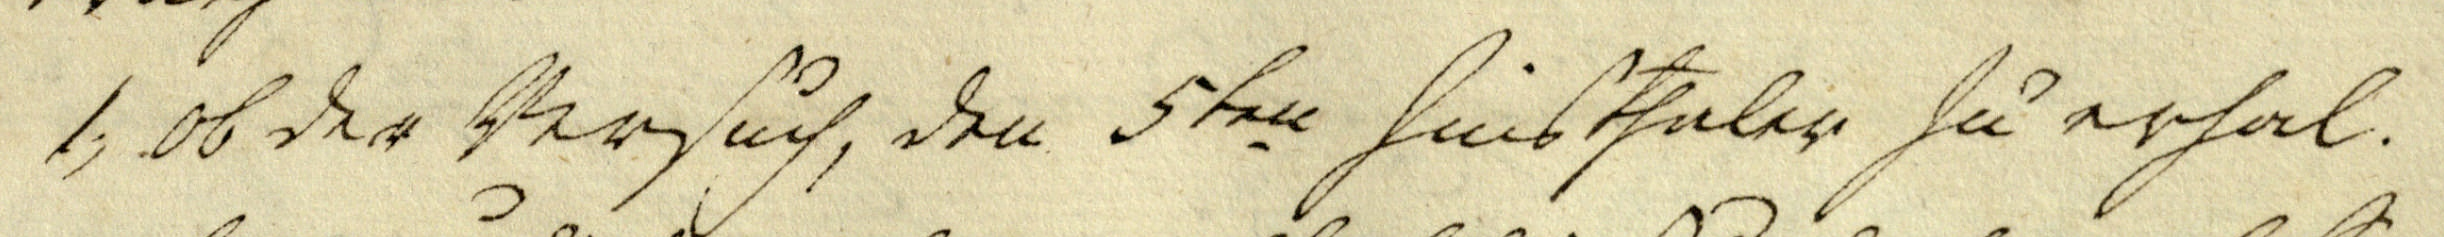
1, ob der Versuch, den 5 ten Zinsthaler zu erhal¬
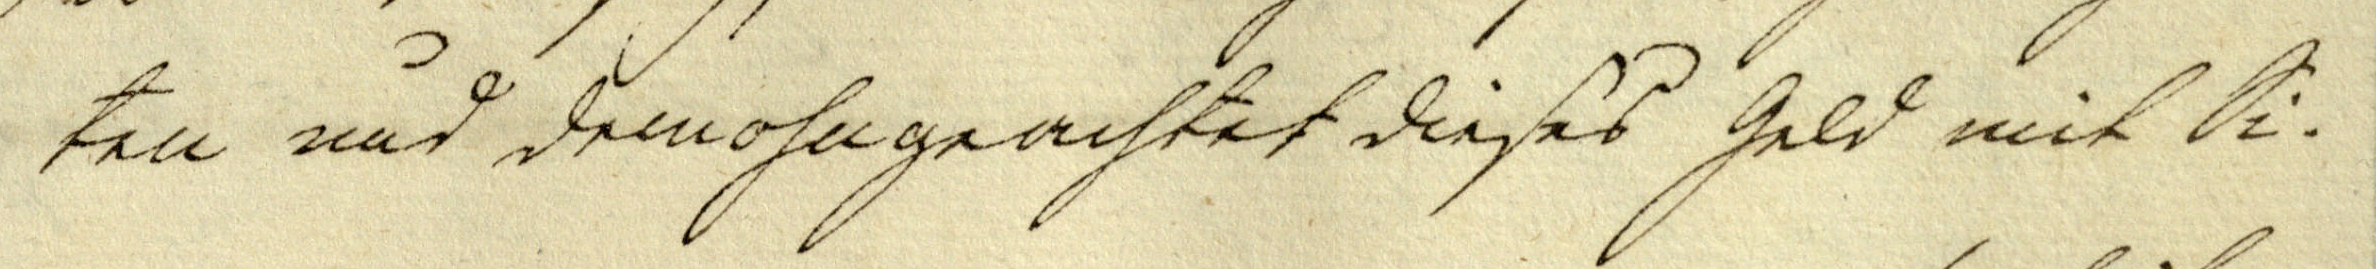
ten und demohngeachtet dieses Geld mit Si¬
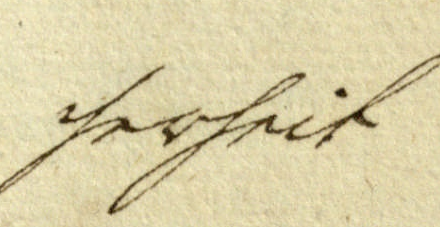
cherheit
